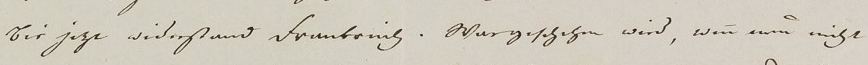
Bis jetzt widerstand Frankreich. Was geschehen wird, wenn nun nicht
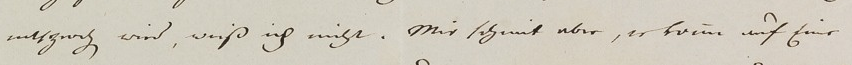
entsprochen wird, weiß ich nicht. Mir scheint aber, es komme auf Eins
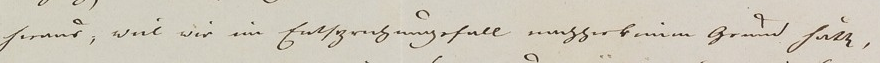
heraus; weil wir im Entsprechungsfall nachher keinen Grund hätten,
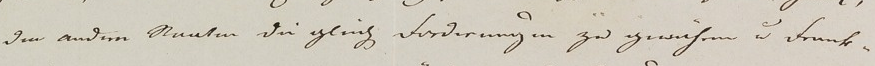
den andern Staaten die gleichen Forderungen zu gewähren u Frank-
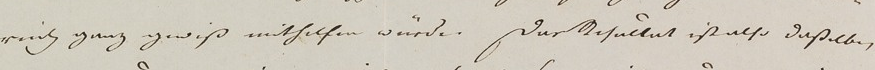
reich ganz gewiß mithelfen würde. Das Resultat ist also daßelbe,
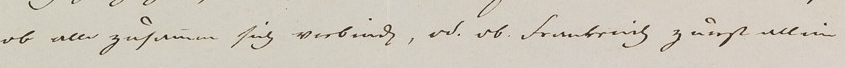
ob alle zusammen sich verbinden, od. ob Frankreich zuerst allein
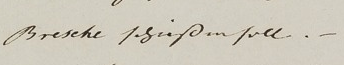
Bresche schießen soll. –
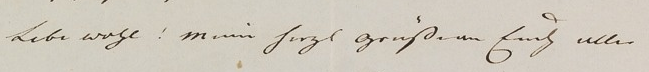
Lebe wohl! Meine herzl Grüße an Euch alle
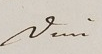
Dein
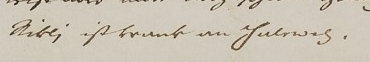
Rikli ist krank an Halsweh.
